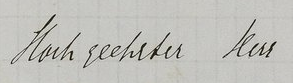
Hochgeehrter Herr
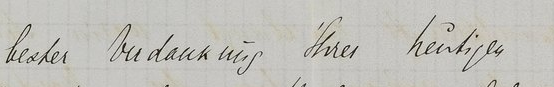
bester Verdankung Ihrer heutigen
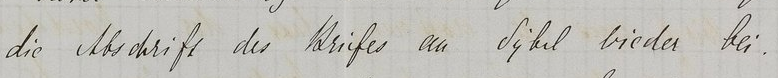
die Abschrift des Briefes an Sybel wieder bei.
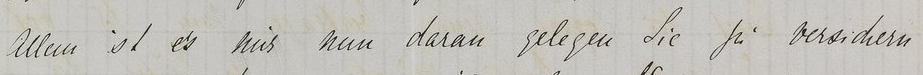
allem ist es mir nun daran gelegen Sie zu versichern
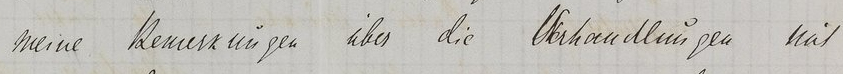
meine Bemerkungen über die Verhandlungen mit
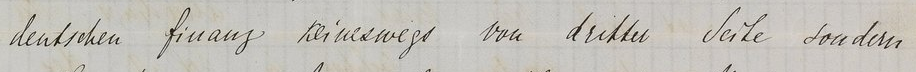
deutschen Finanz keineswegs von dritter Seite sondern
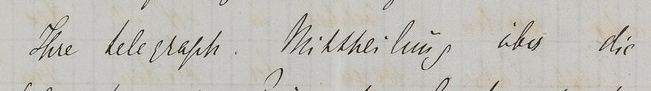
Ihre telegraph. Mittheilung über die
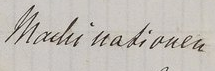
Machinationen
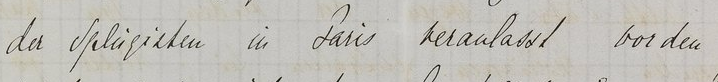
der Splügisten in Paris veranlasst worden
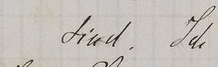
sind. Ich
